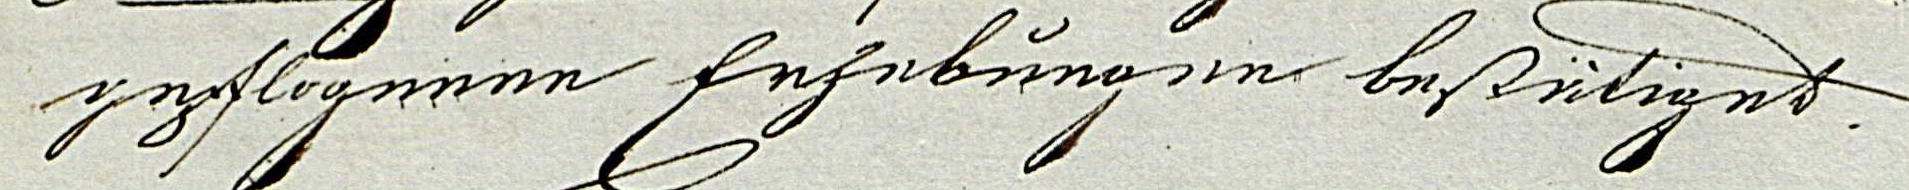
gepflogenen Erhebungen bestätiget.
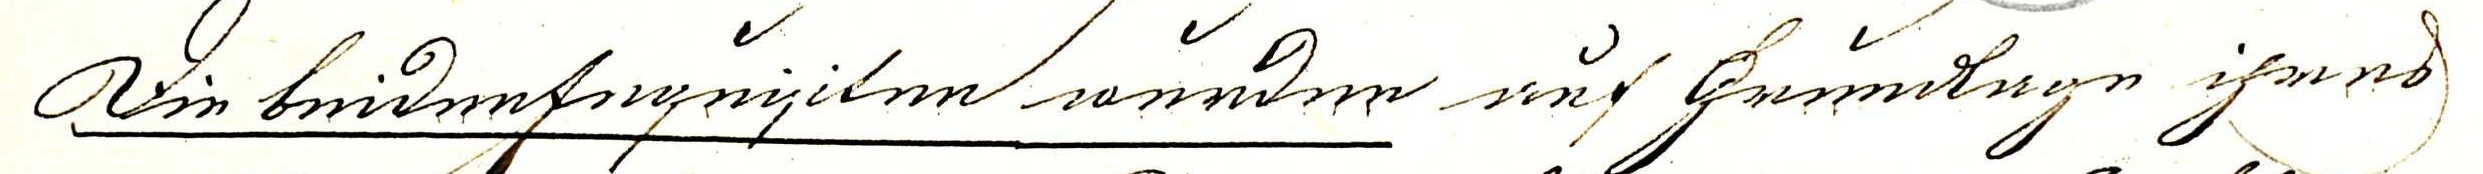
Die beiden Inquisiten wurden auf Grundlage ihres
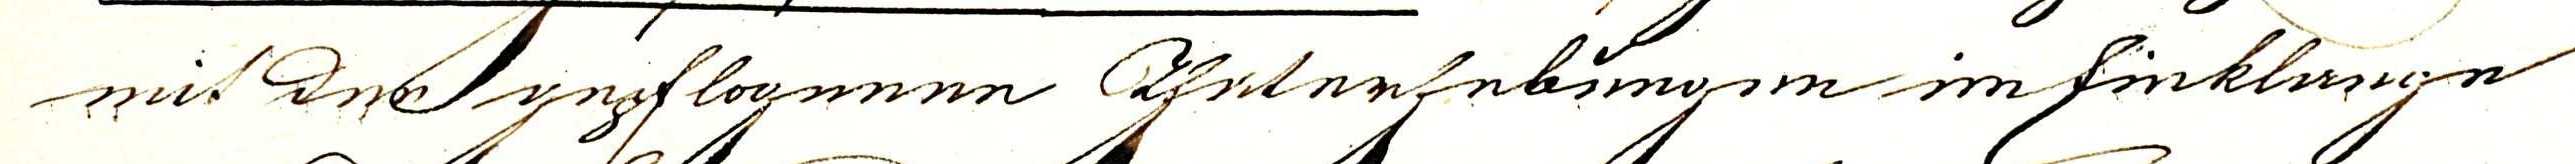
mit der gepflogenen Thaterhebungen in Einklange
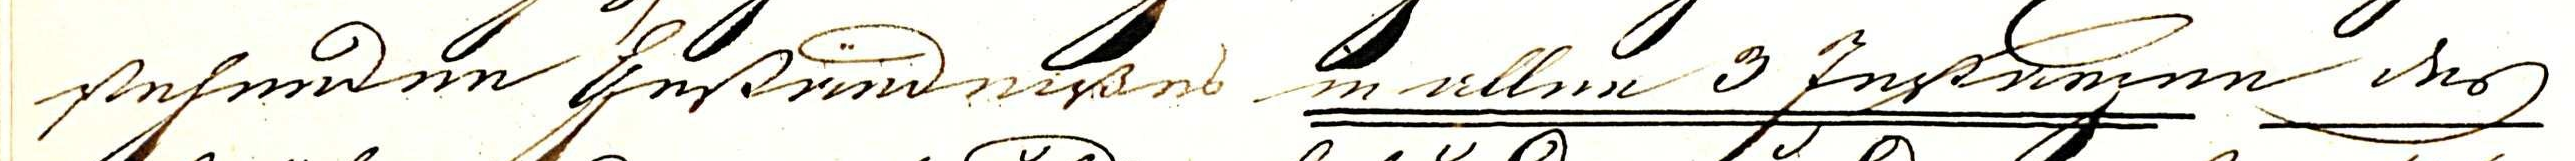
stehenden Geständnißes in allen 3 Instanzen des
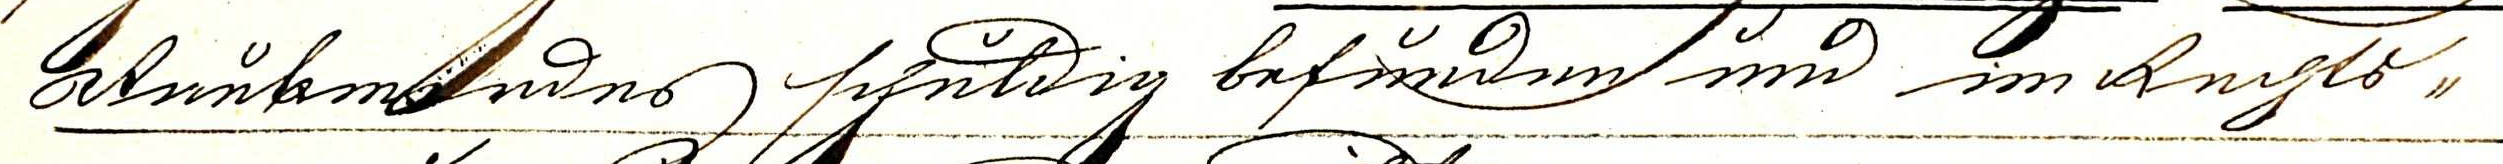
Raubmordes schuldig befunden und in Rechts¬
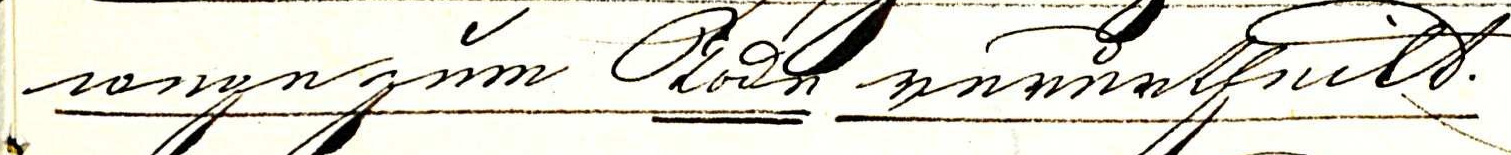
wege zum Tode verurtheilt.
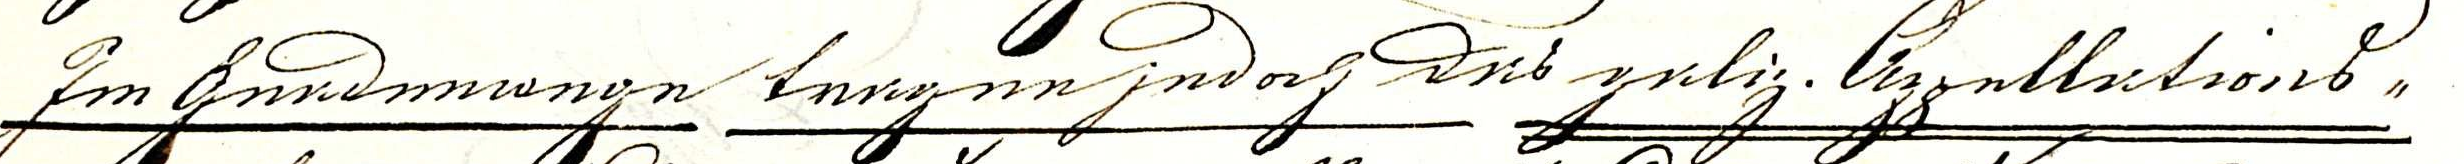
Im Gnadenwege tragen jedoch das galiz. Appellations¬
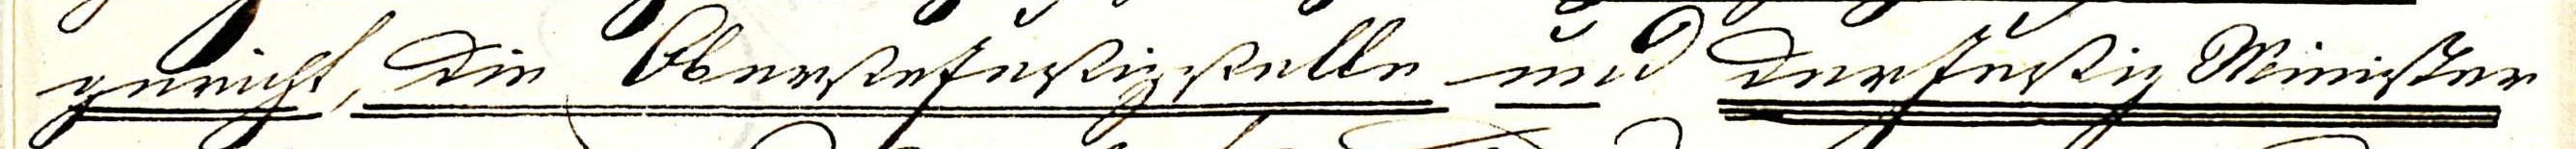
bericht die ObersteJustizstelle und der Justiz Minister
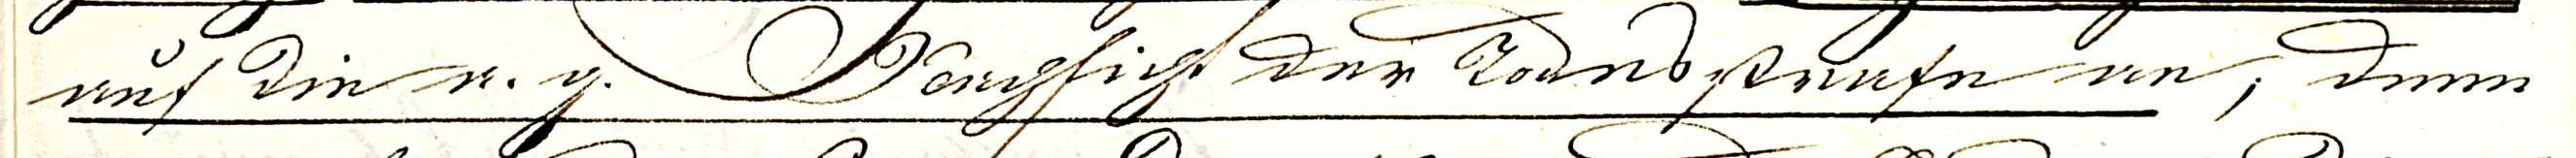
auf die a.g. Nachsicht der Todesstrafe an, denn
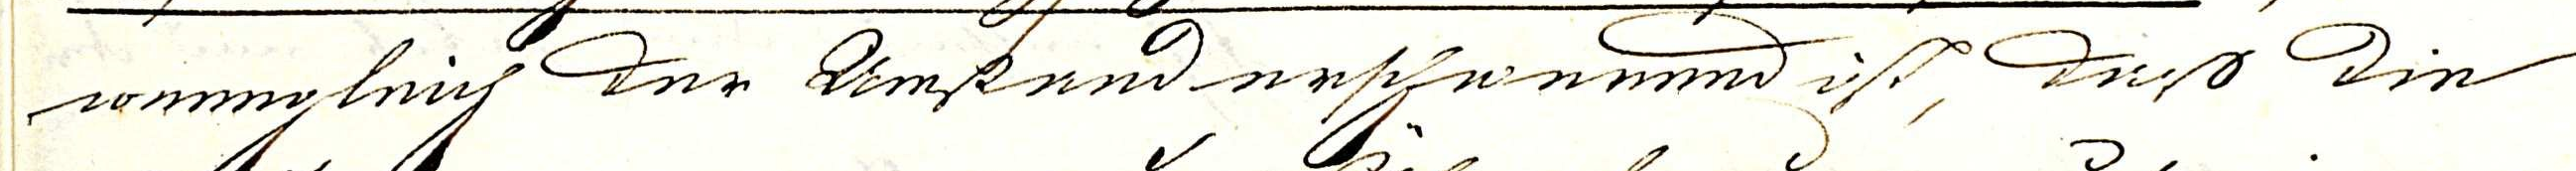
wenngleich der Umstand erschwerend ist, daß die
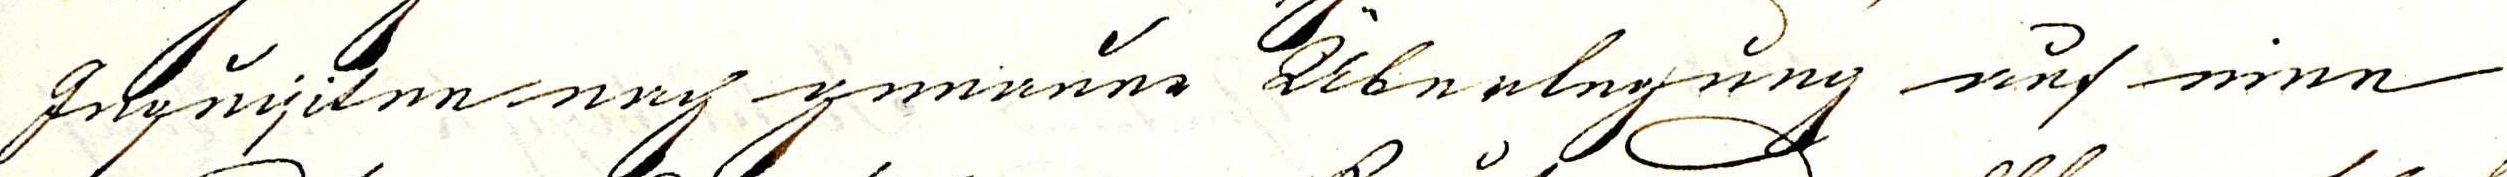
Inquisiten nach genaue Überlegung auf eine
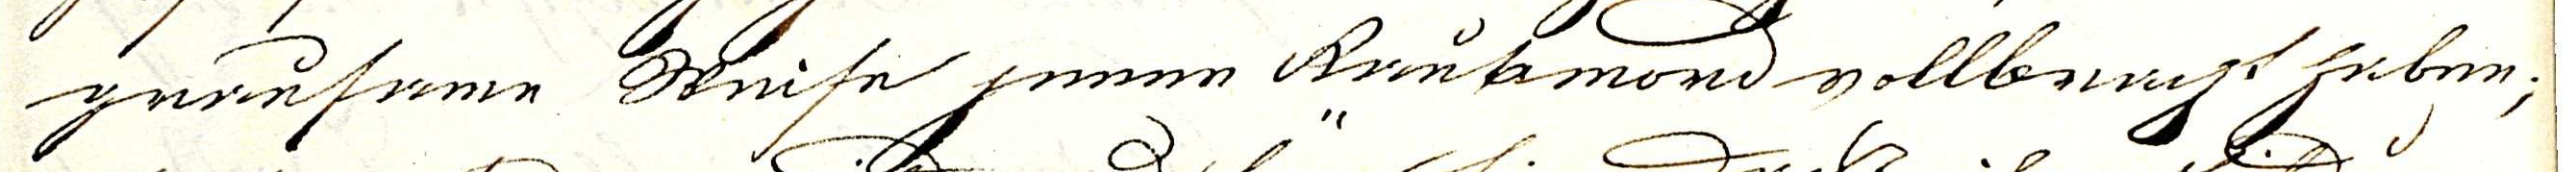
grausame Weise jenen Raubmord vollbracht haben,
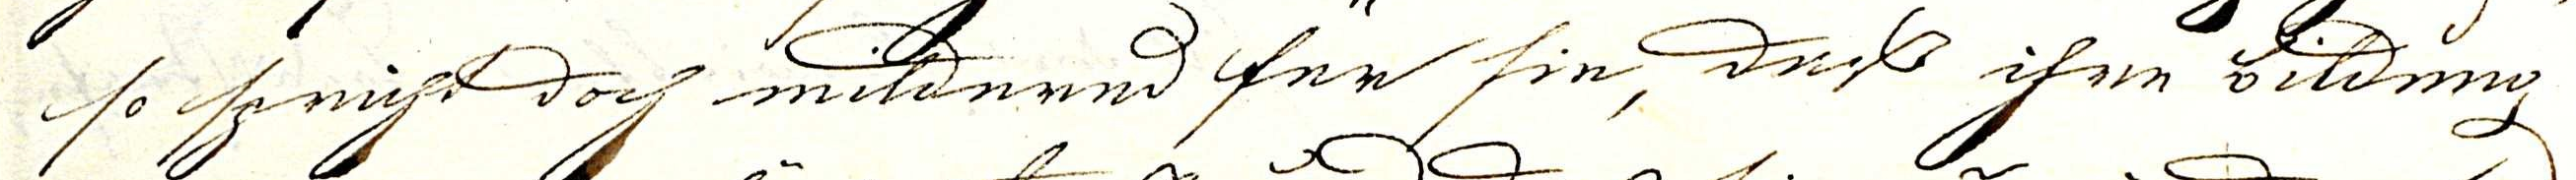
so spricht doch mildern für sie, daß ihre Bildung
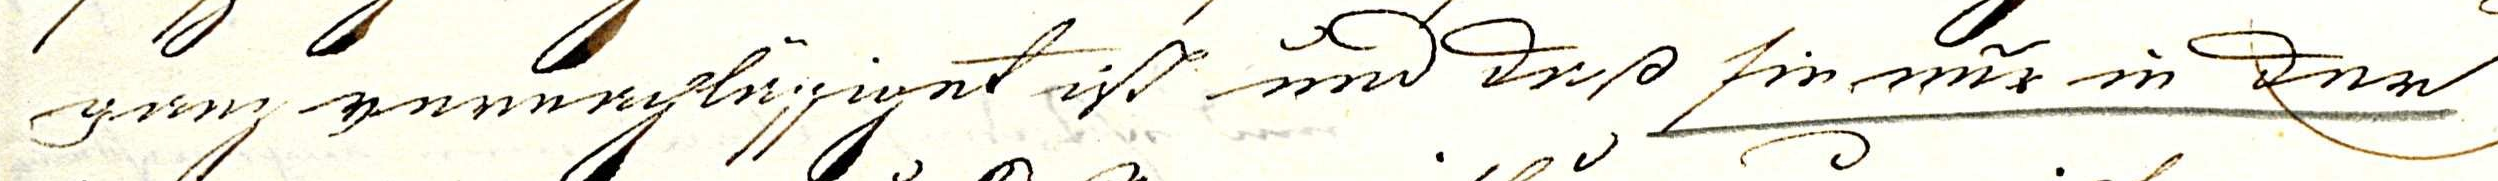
ganz vernachlässigt ist und das sie nur in der
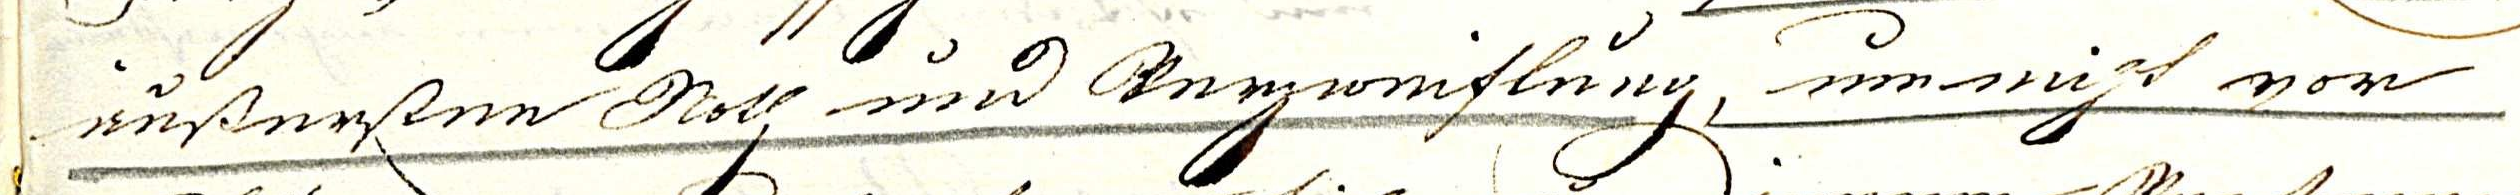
äußersten Noth und Verzweiflung, um sich vor
